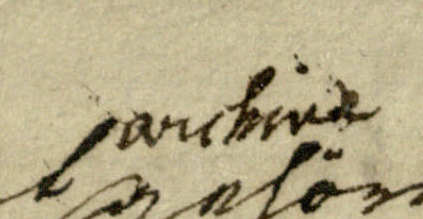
archive
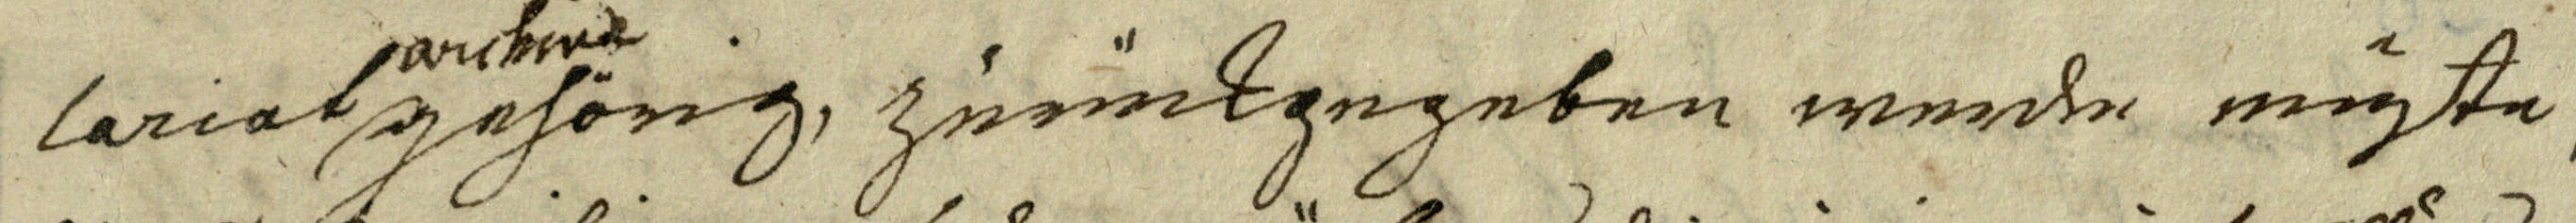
larial gehörig, zurückgegeben werden mögte,
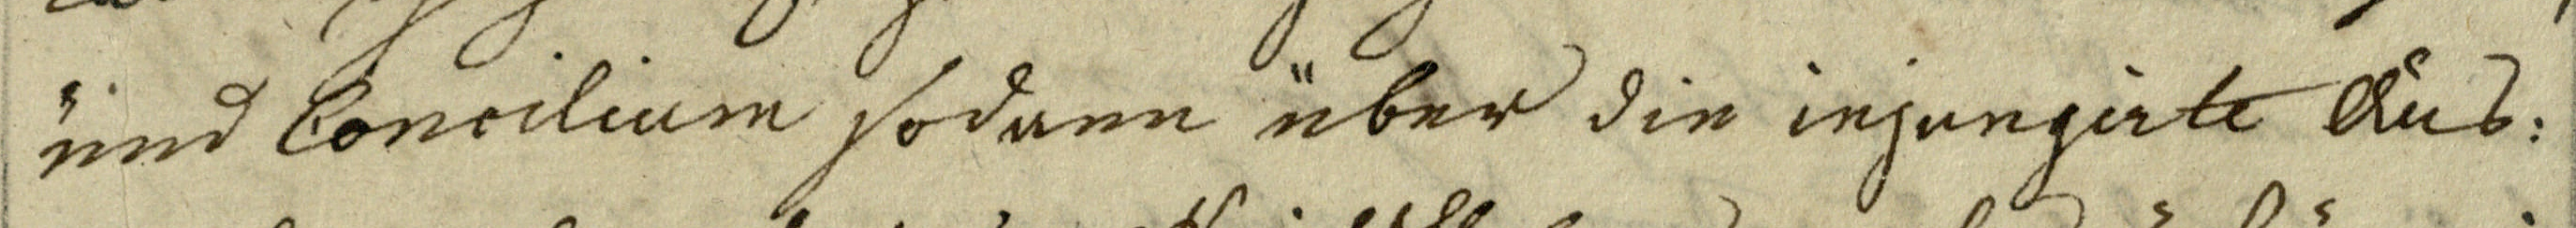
und Cocilium sodann über die injungirte Aus¬
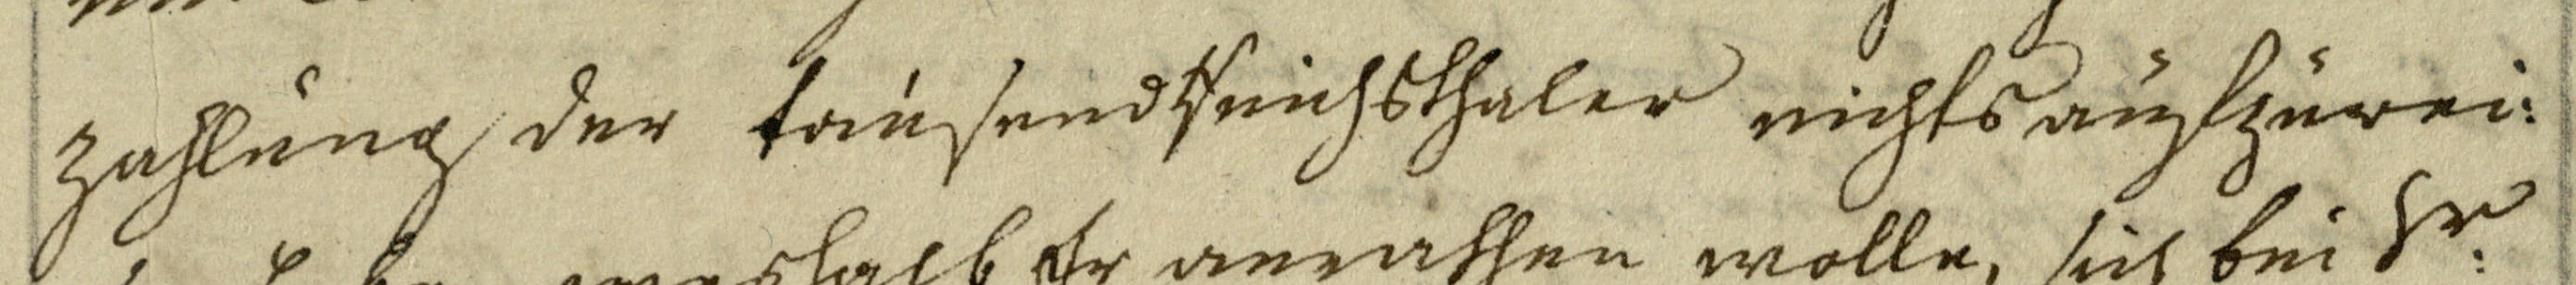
zahlung der Tausend Reichsthaler nichts aufzuwei¬
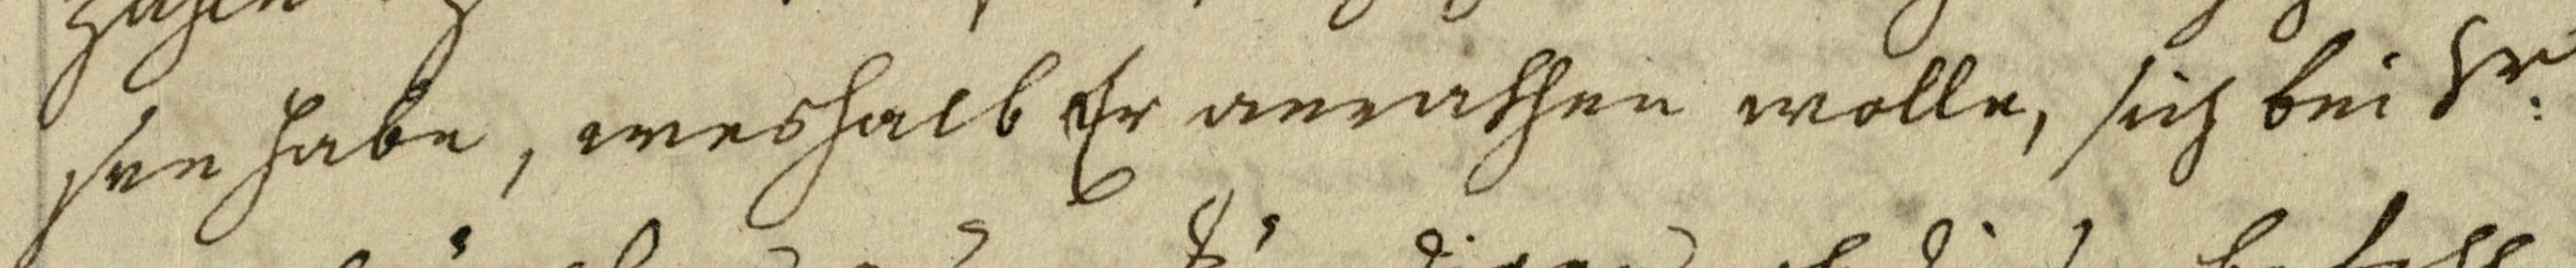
sen habe, weshalb Er anrathen wolle, sich bei Sr
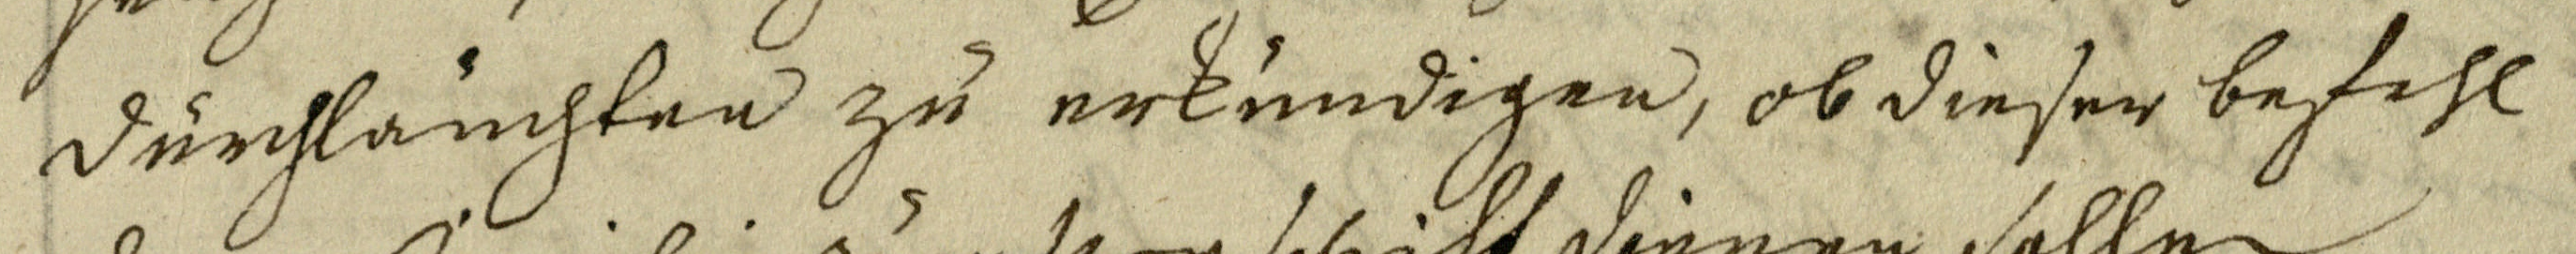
Durchlauchten zu erkundigen, ob dieser Befehl
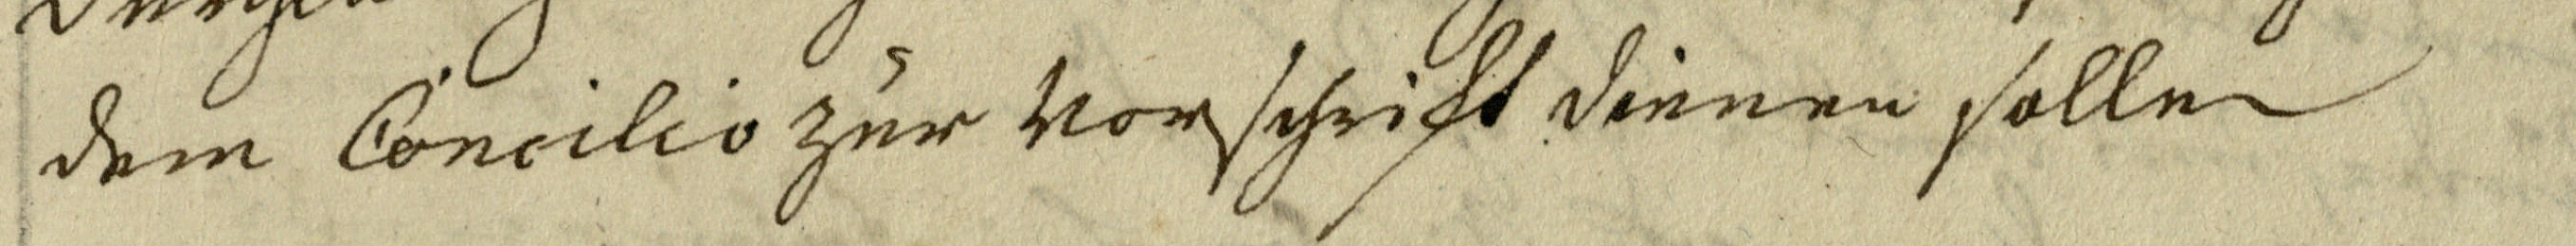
dem Concilio zur Vorschrift dienen solle
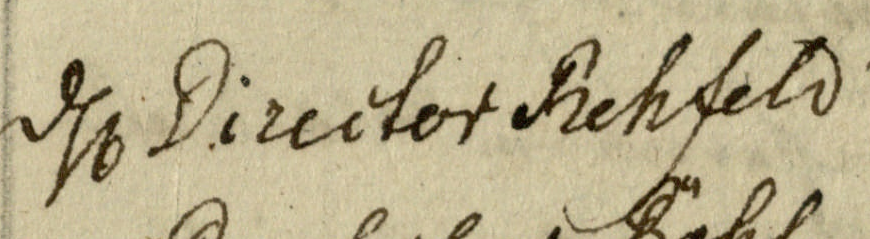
dh. Director Rehfeld
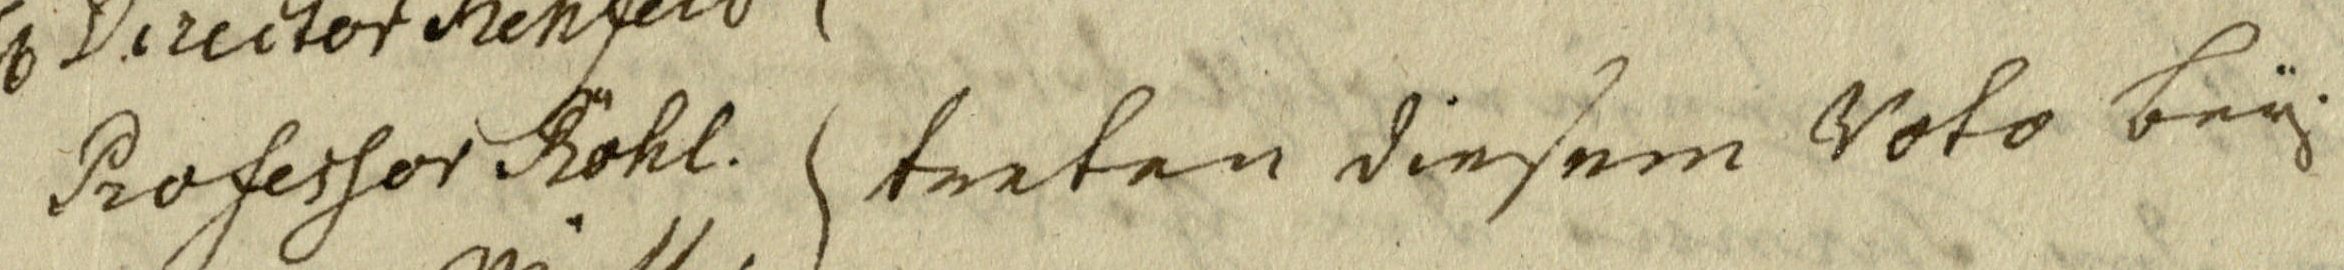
Professor Röhl treten diesem Voto beÿ.
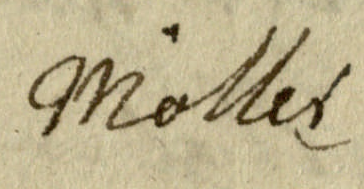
Möller
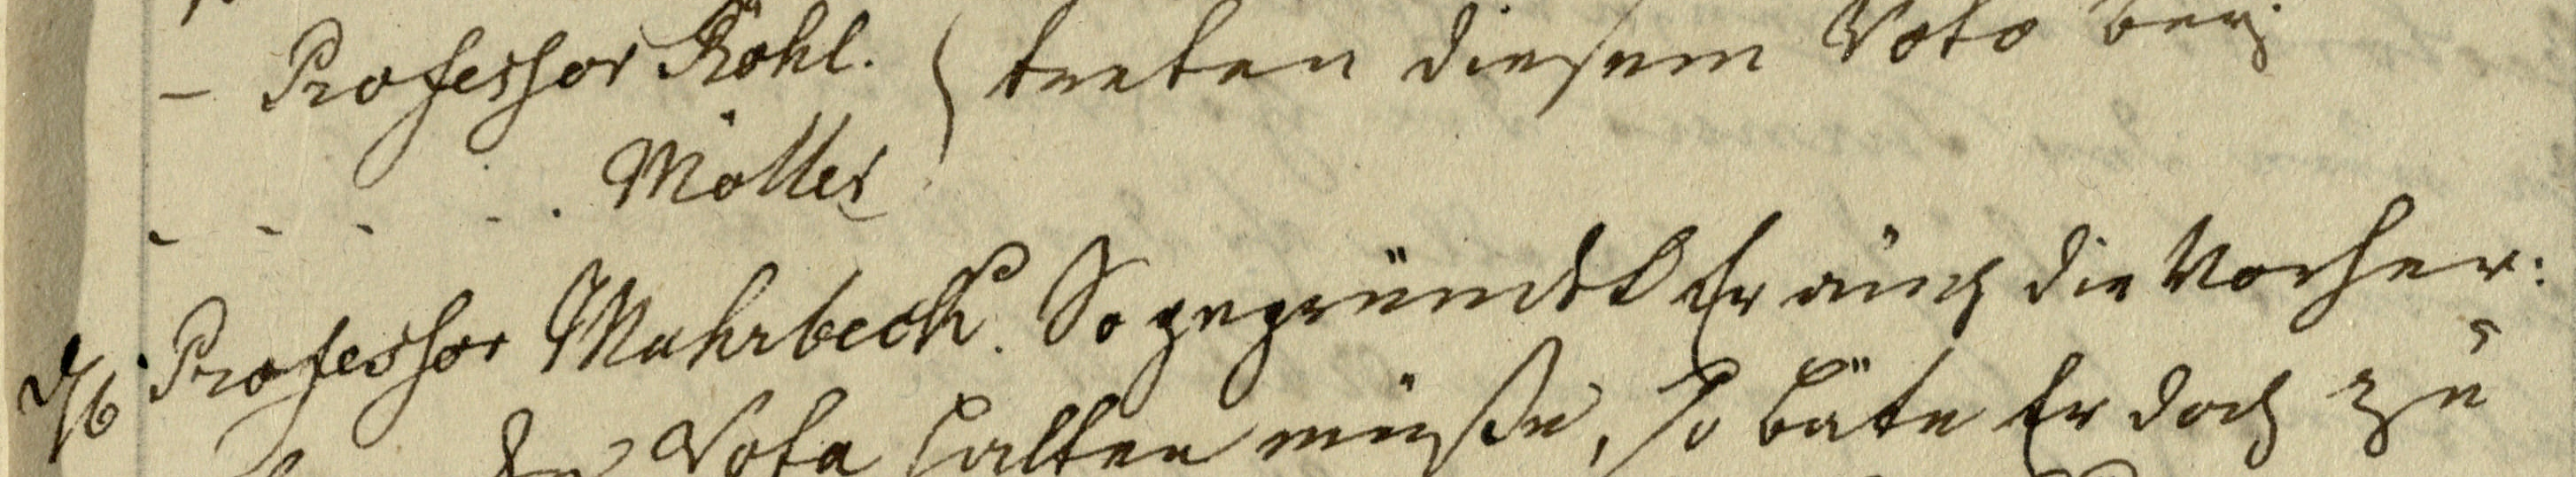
dh. Professor Muhrbeck. So gegründet Er auch die vorher¬
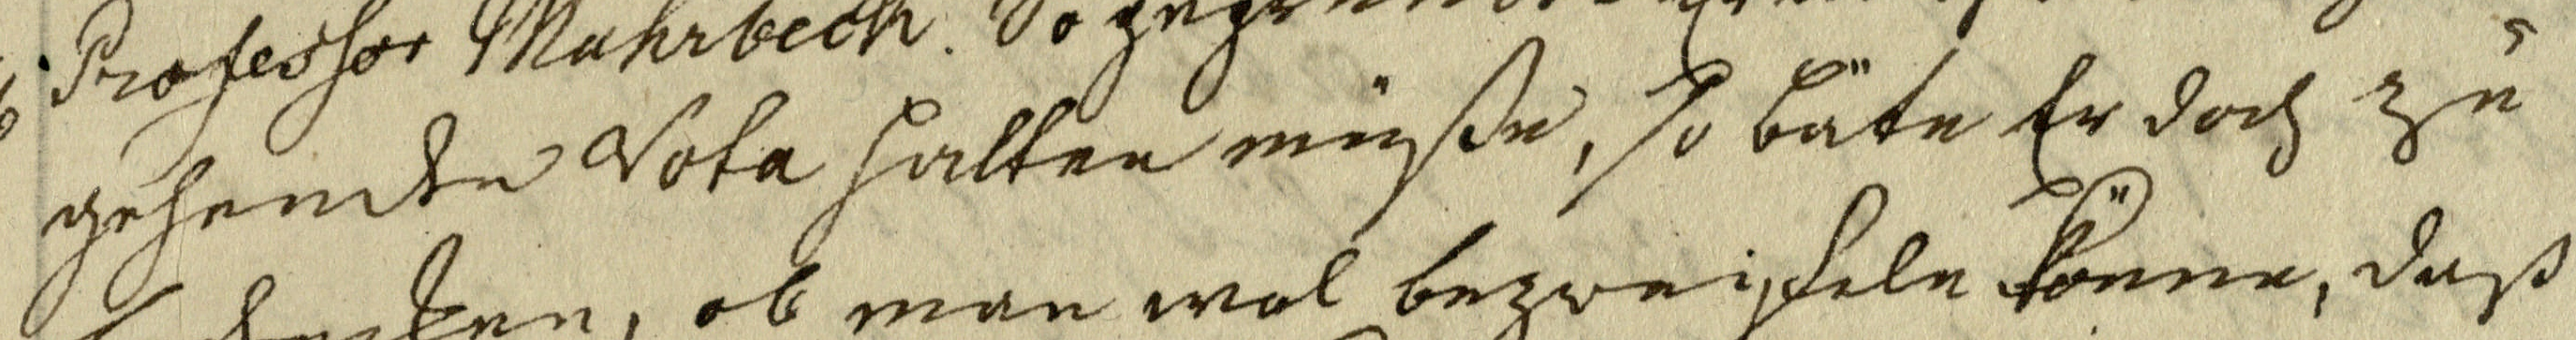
gehenden Vota halten müße, so bäte Er doch zu
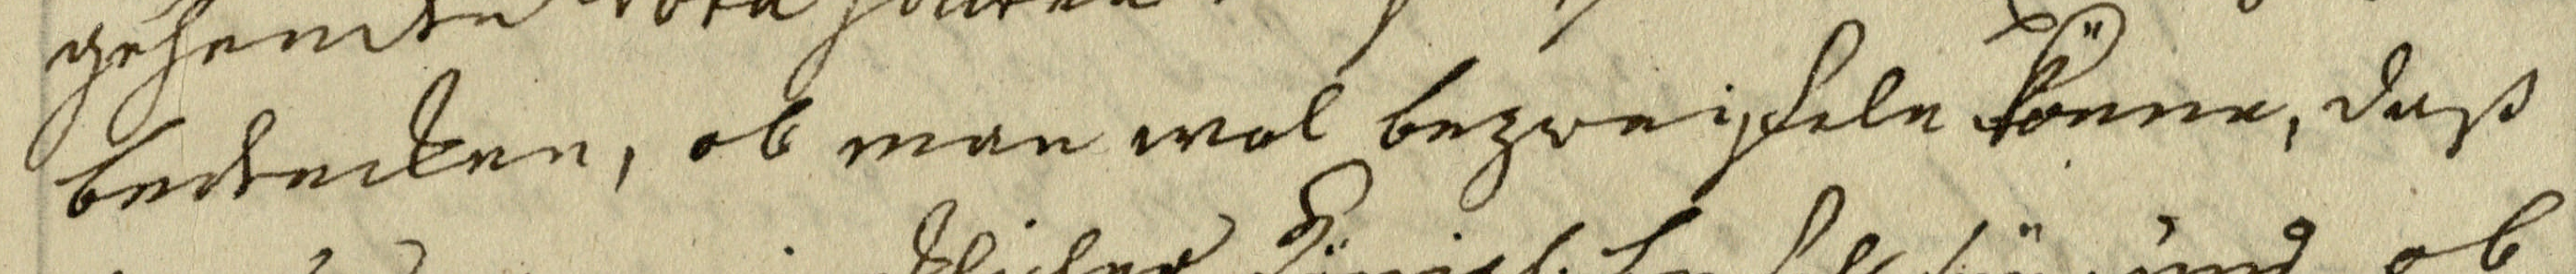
bedencken, ob man wohl bezweifeln könne, daß
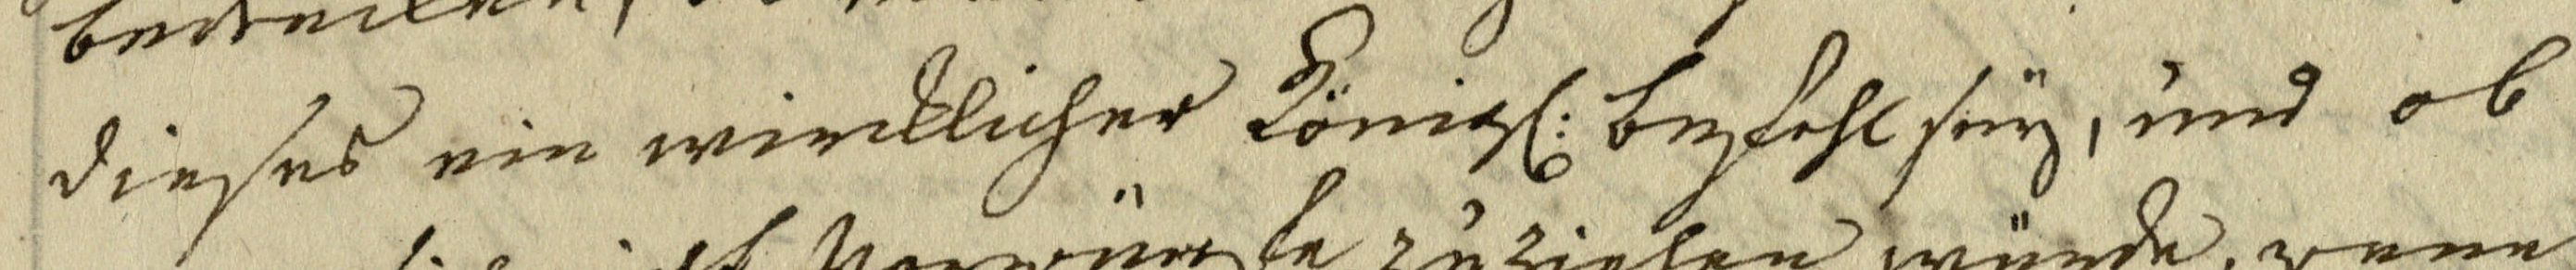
dieser ein wircklicher Königl. Befehl seÿ,und ob
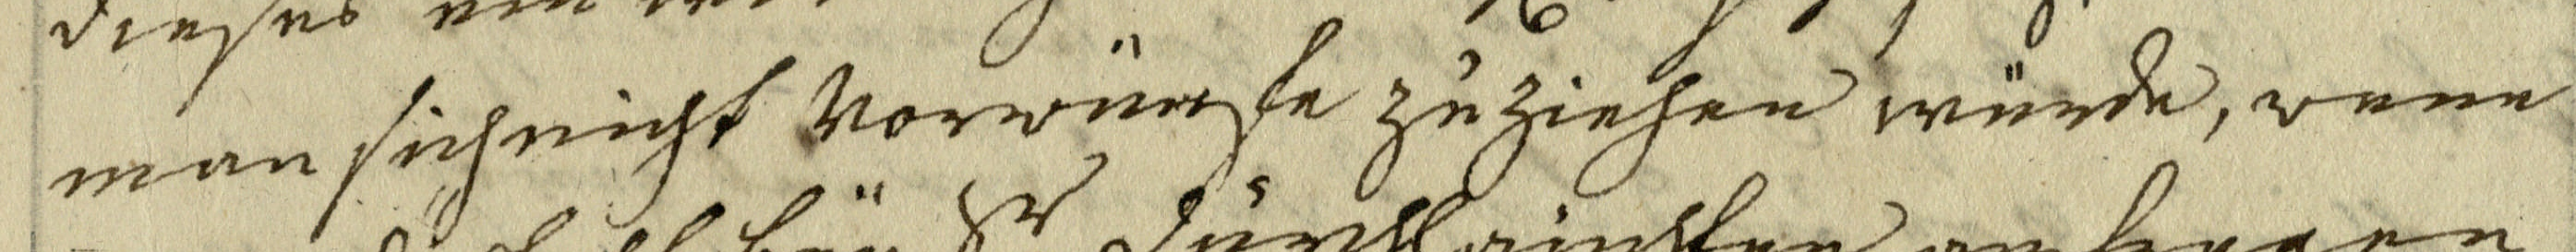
man sich nicht Vorwürfe zuziehen würde, wenn
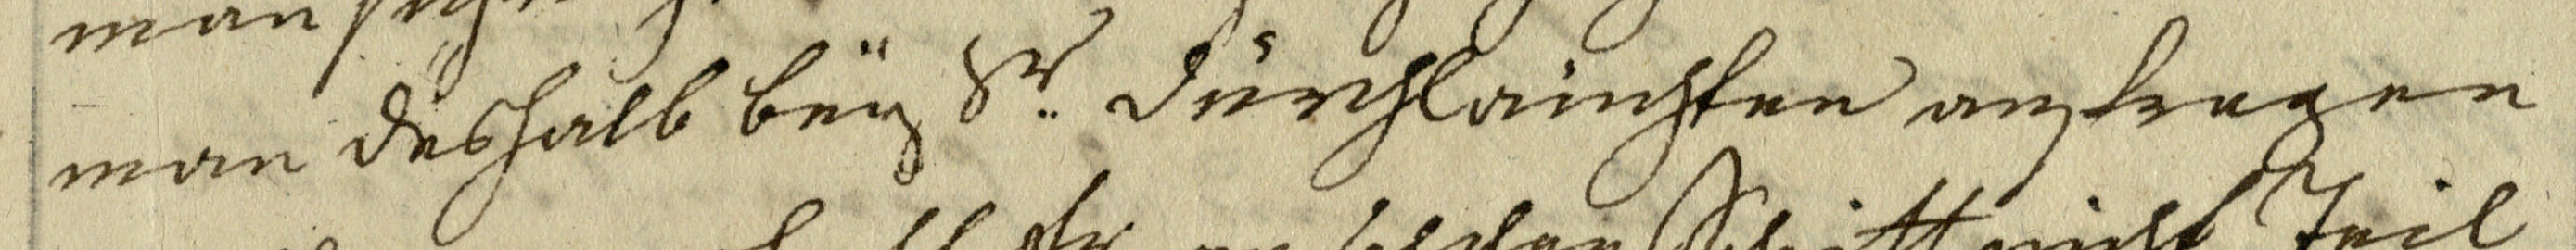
man deshalb beÿ Sr Durchlauchten anfragen
